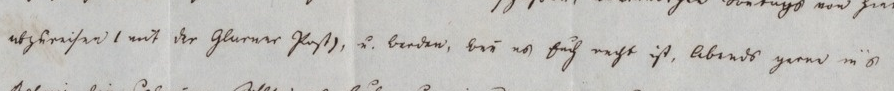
abzureisen (mit der Glarner Post), u. werden, wenn es Euch recht ist, Abends gerne in's
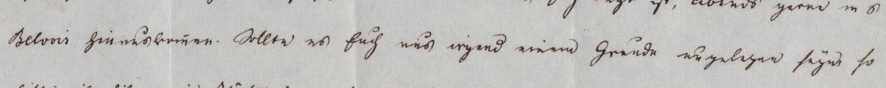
Belvoir hinauskommen. Sollte es Euch aus irgend einem Grunde ungelegen seyn, so
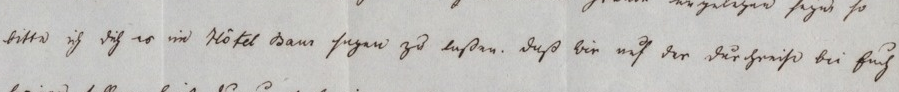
bitte ich dich es im Hôtel Baur sagen zu lassen. Daß wir auf der Druchreise bei Euch
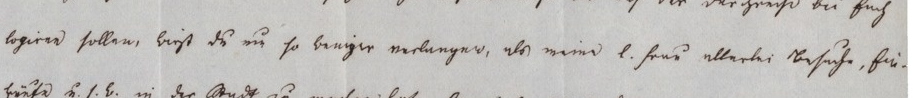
logiren sollen, wirst du um so weniger verlangen, als meine l. Frau allerlei Besuche, Ein-
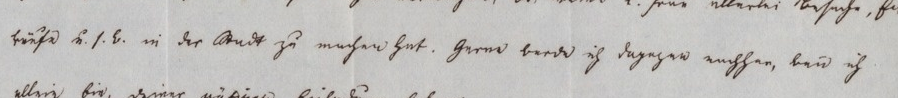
käufe u. s. w. in der Stadt zu machen hat. Gerne werde ich dagegen nachher, wenn ich
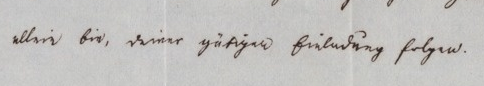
allein bin, deiner gütigen Einladung folgen.
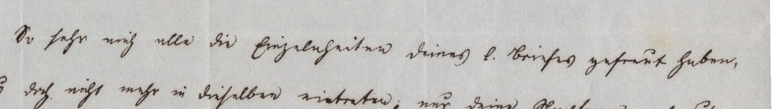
So sehr mich alle die Einzelnheiten deines l. Briefes gefreut haben,
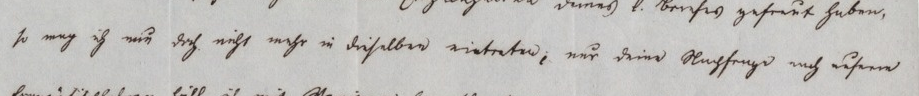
so mag ich nun doch nicht mehr in dieselben eintreten; nur deine Nachfrage nach unserm
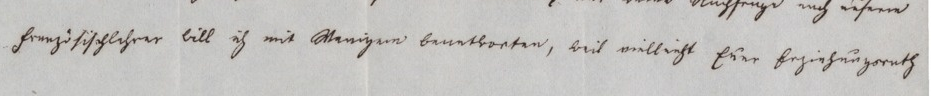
Französischlehrer will ich mit Wenigem beantworten, weil vielleicht Euer Erziehungsrath
